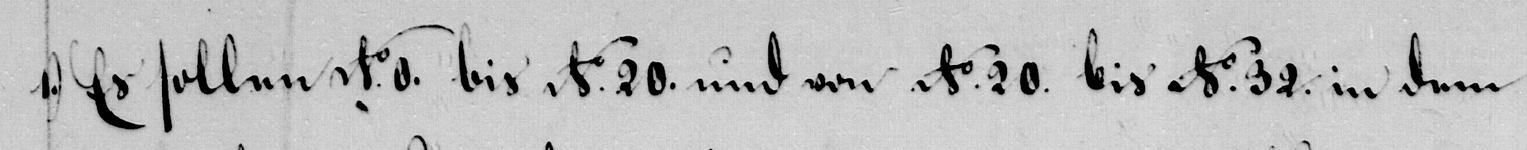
1.) Es sollen No. 0. bis No. 20. und von No. 20. bis No. 32 in dem
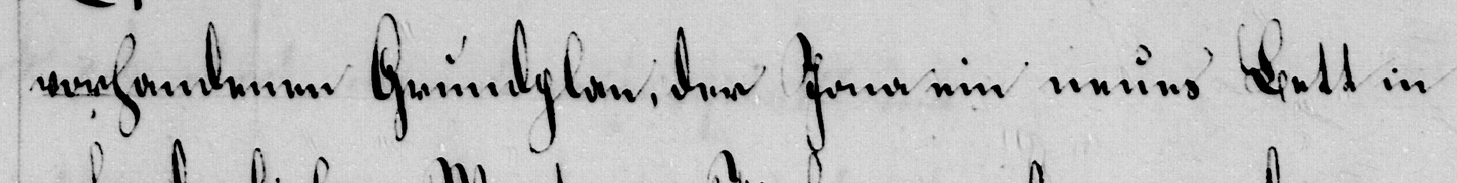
vorhandenen Grundplan, der Jona ein neues Bett in
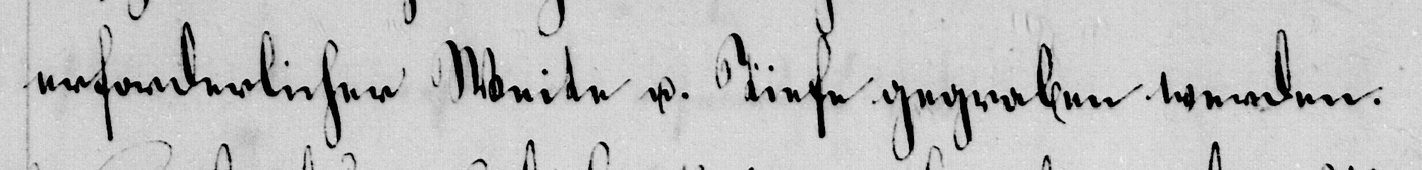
erforderlicher Weite u. Tiefe gegraben werden.
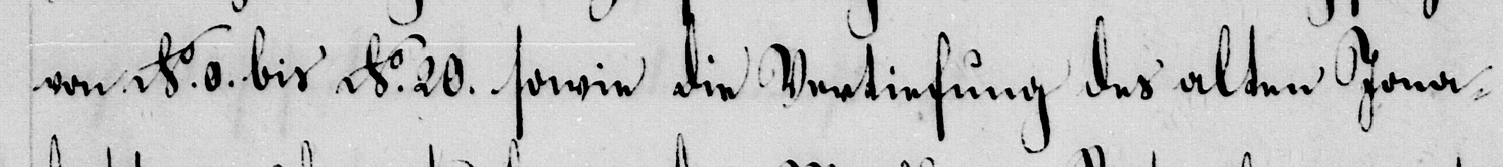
von No. 0. bis No. 20. sowie die Vertiefung des alten Jona¬
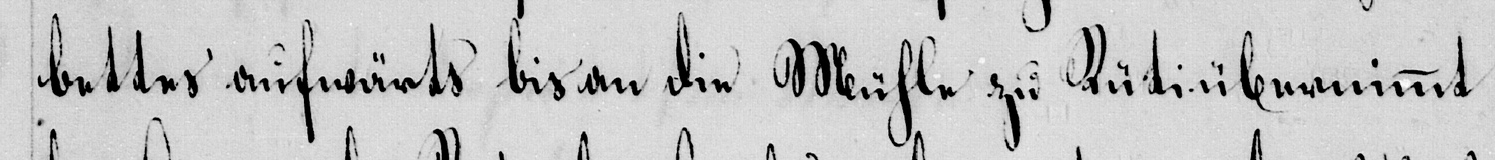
bettes aufwärts bis an die Mühle zu Rüti übernimmt
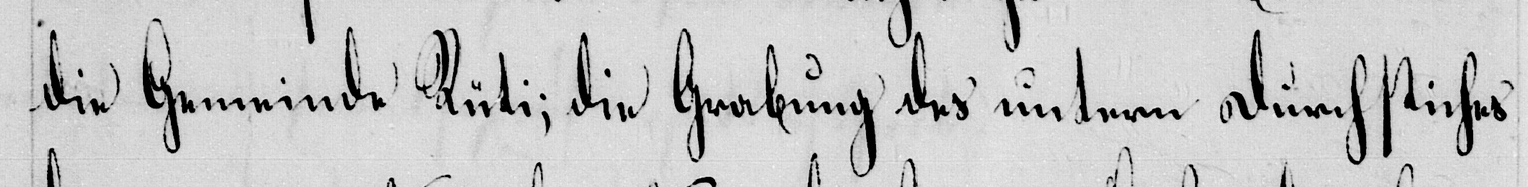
die Gemeinde Rüti; die Grabung des untern Durchstiches
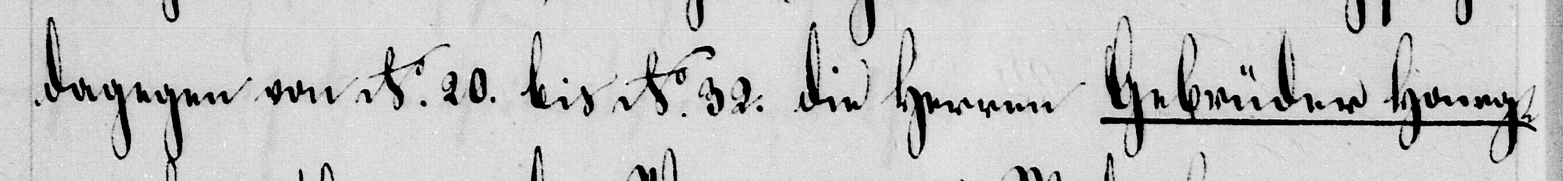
dagegen von No. 20. bis No. 32. die Herren Gebrüder Honeg¬
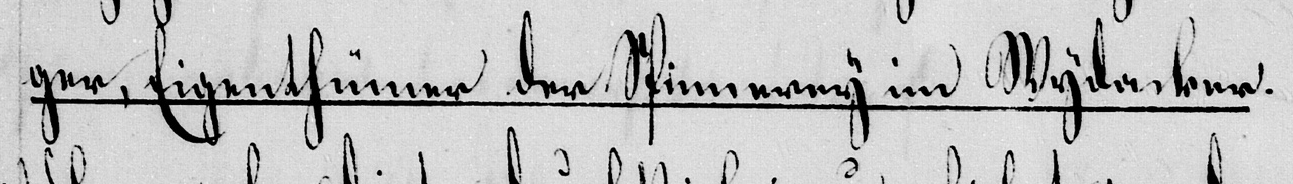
ger, Eigenthümer der Spnnerey im Wydacker.
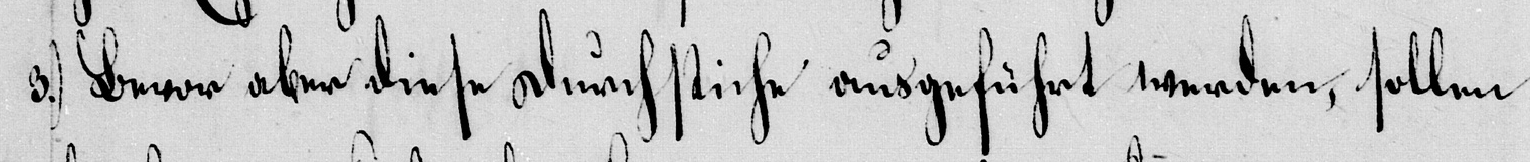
3.) Bevor aber diese Durchstiche ausgeführt werden, sollen
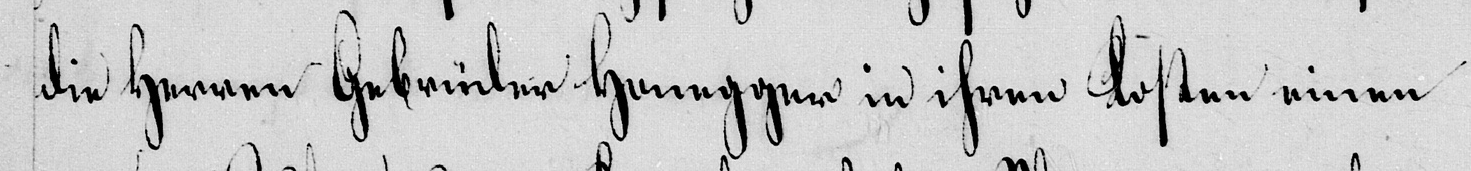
die Herren Gebrüder Honegger in ihren Kosten einen
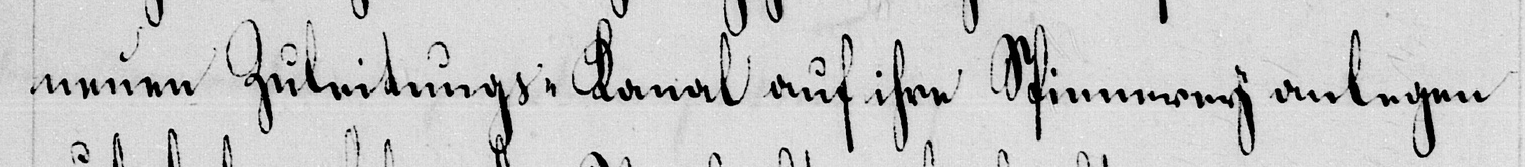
neuen Zuleitungs-Kanal auf ihre Spinnerey anlegen
